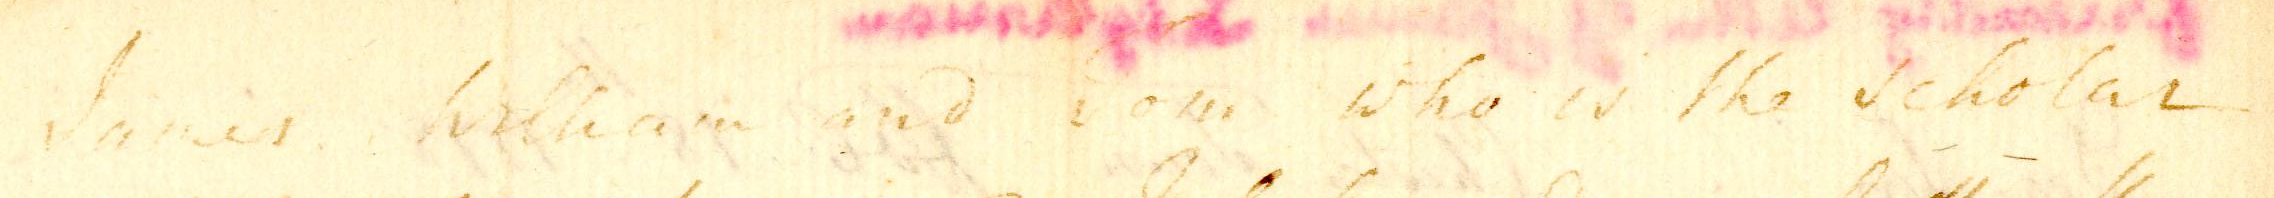James William and Tom who is the scholar
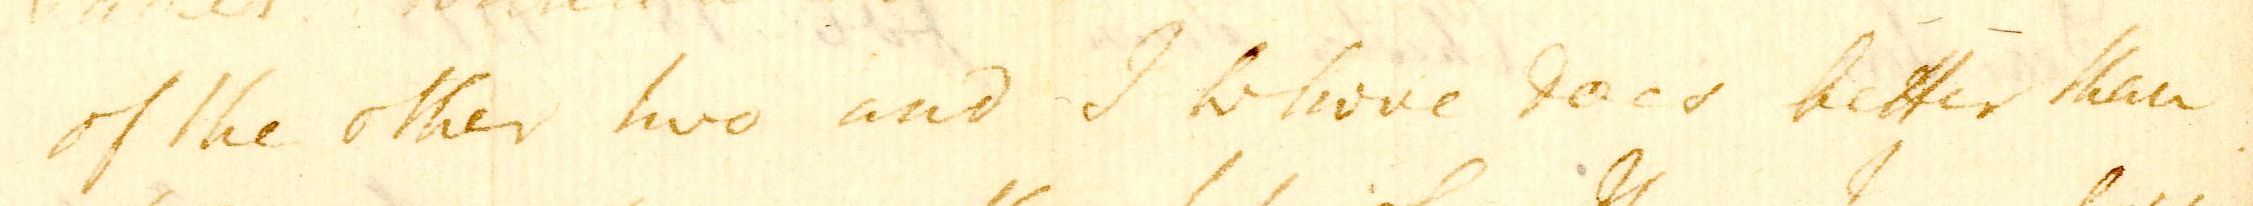of the other two and I believe does better than
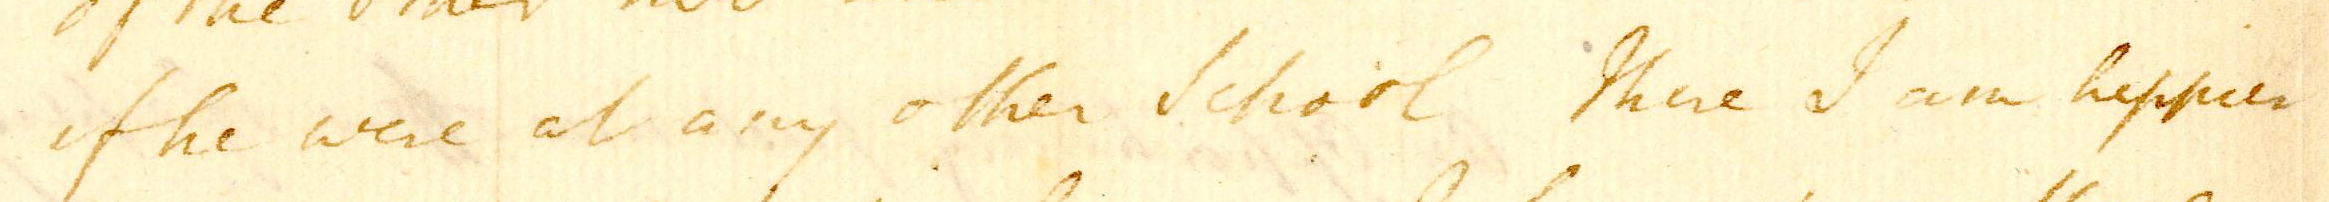if he were at any other school There I am happier
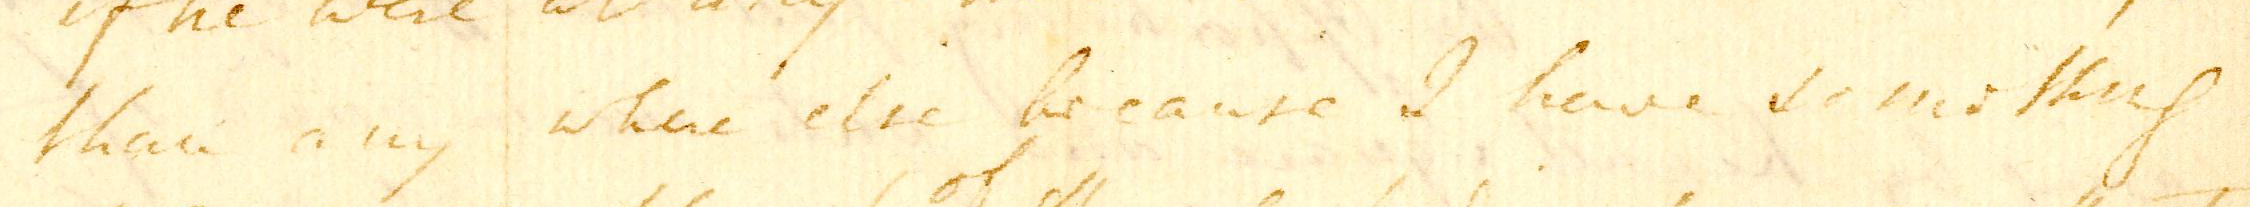than any where else because I have something
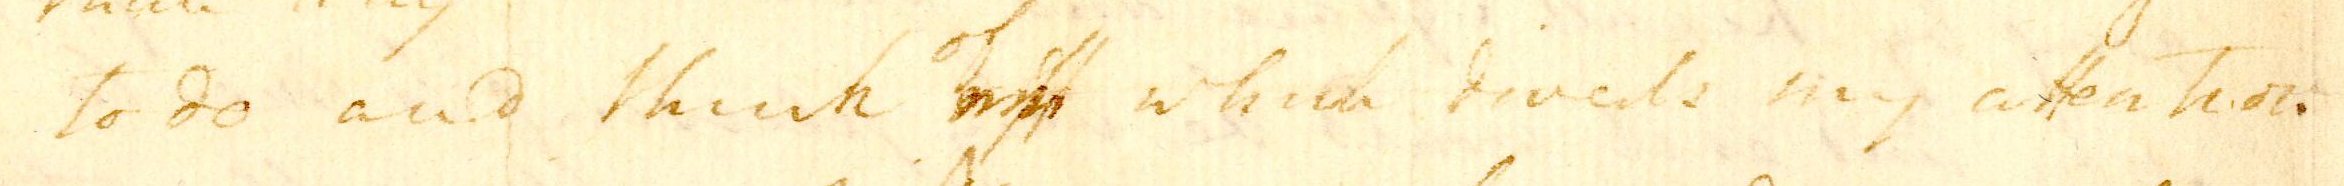to do and think of which directs my attention
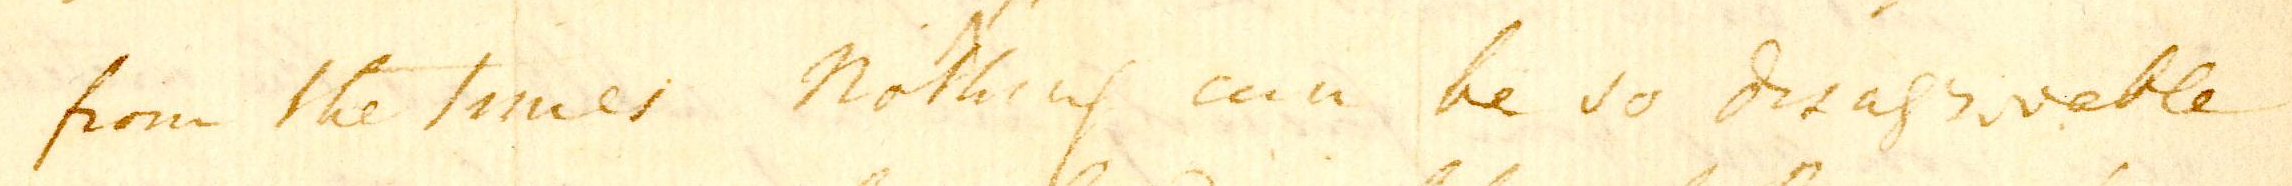from the times Nothing can be so disagreeable
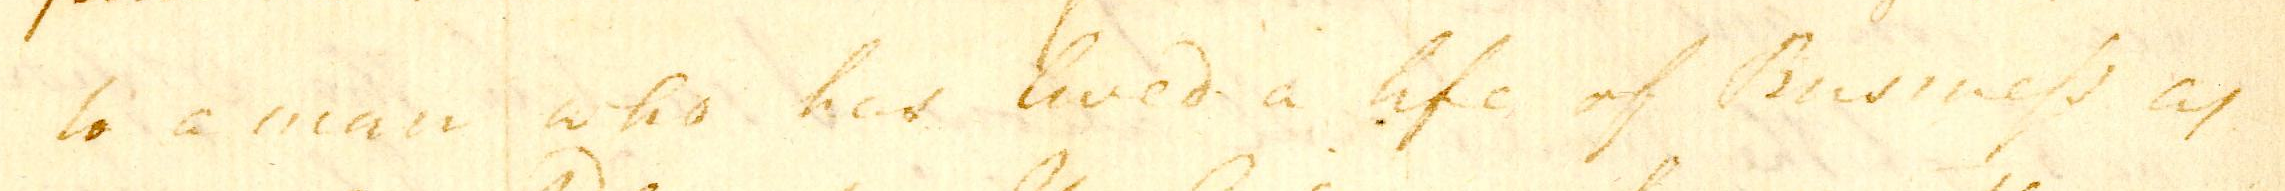to a man who has lived a life of business as
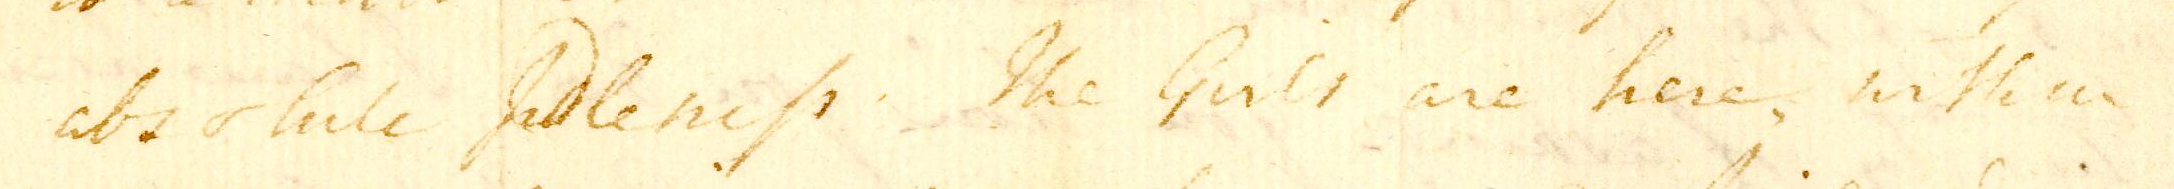absolute Idleness. The Girls are here within
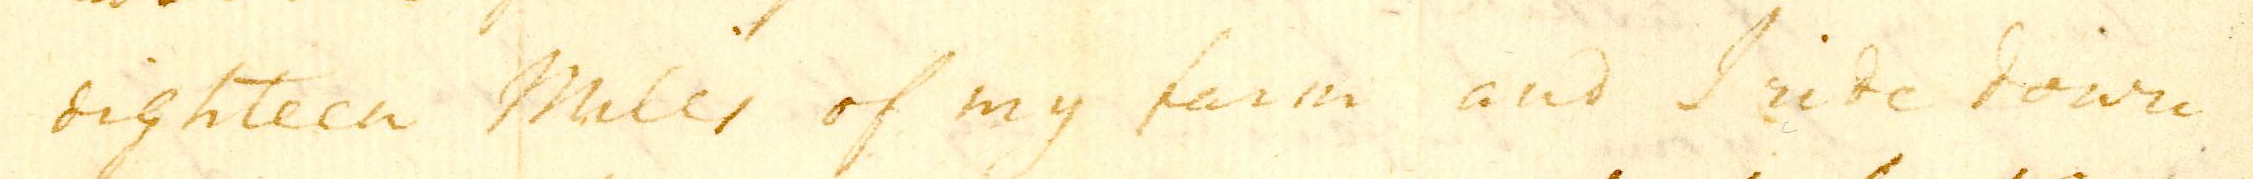eighteen Miles of my farm and I ride down
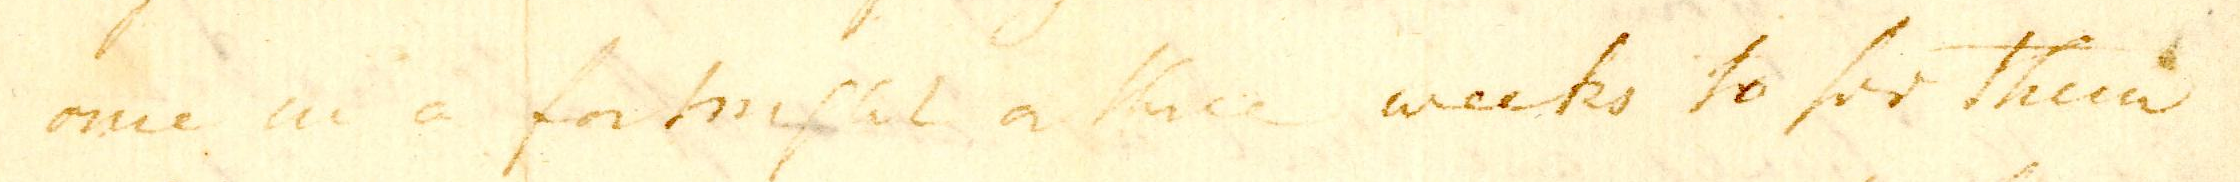once in a fortnight or three weeks to see them
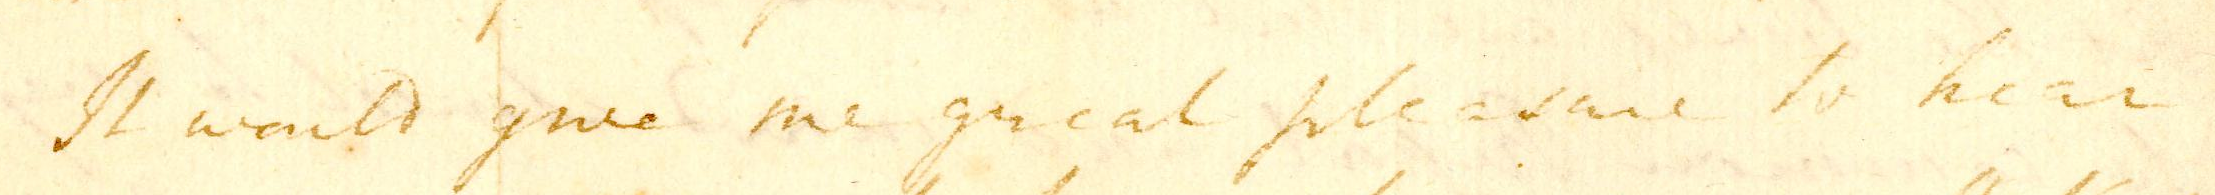It would give me great pleasure to hear
